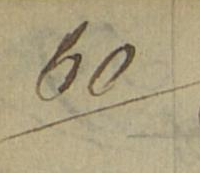60
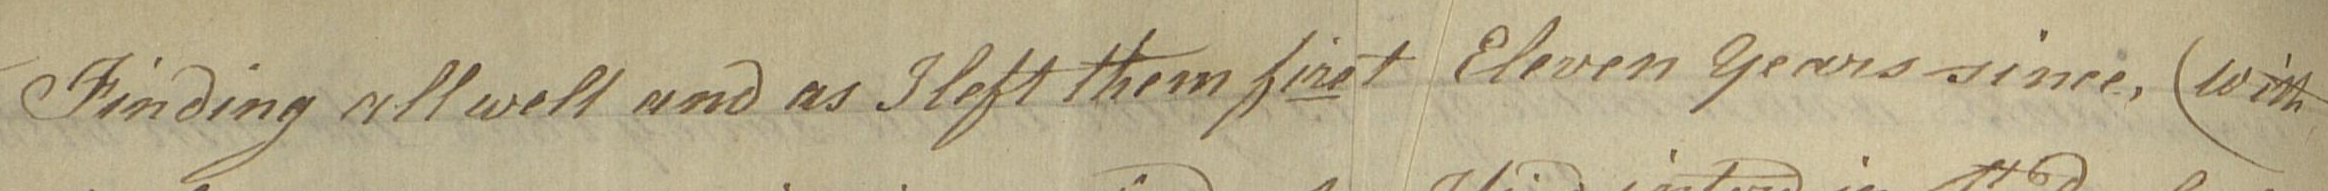Finding all well and as I left them first Eleven Years since (with
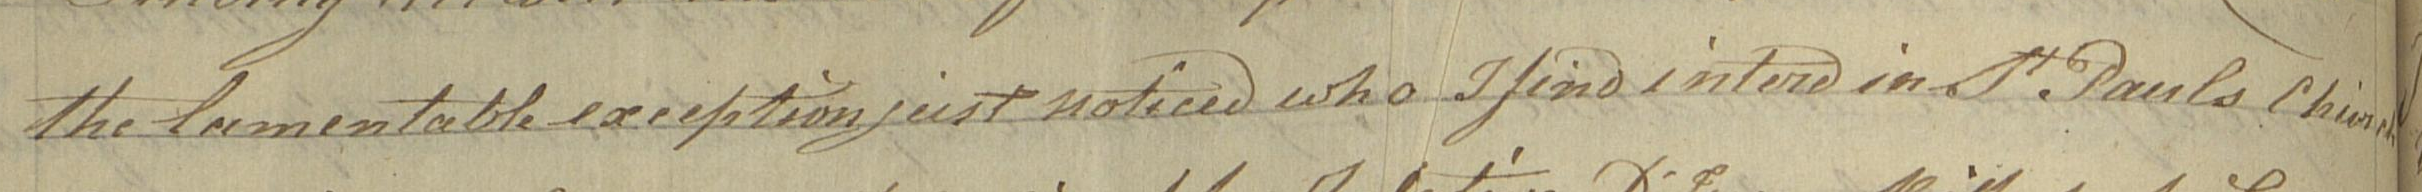the lamentable exception just noticed who I find interd in S^t. Pauls Church
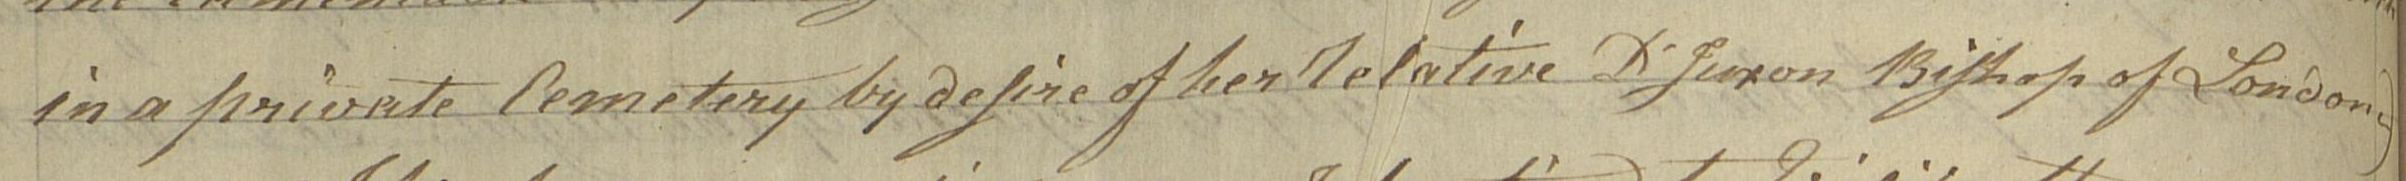in a private Cemetery by desire of her relative D^r Juxon Bishop of London)
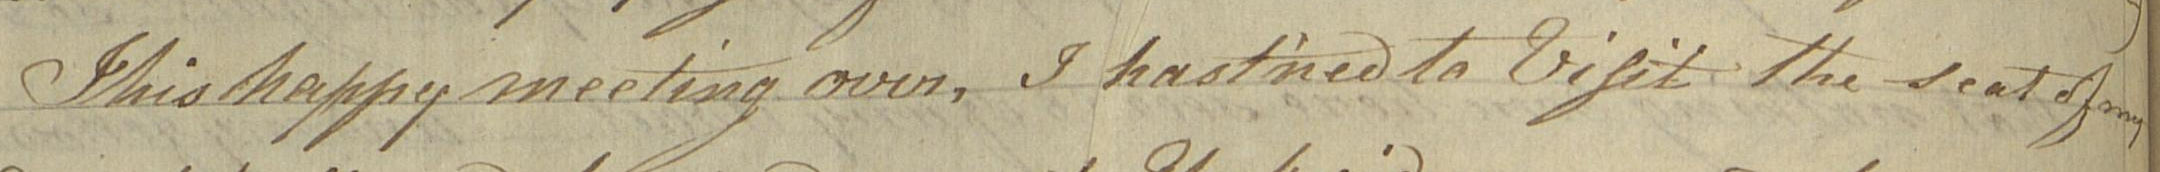This happy meeting over, I hastned to Visit the seat of my
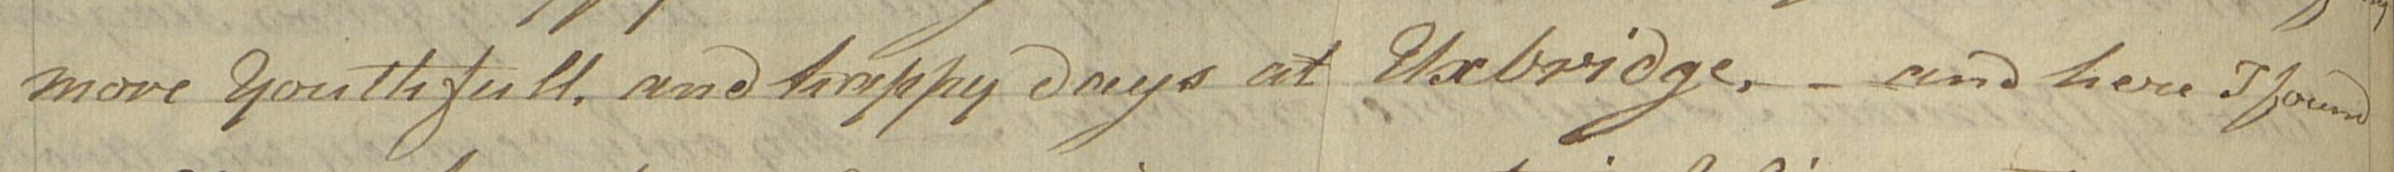more Youthfull and happy days at Uxbridge, and here I found
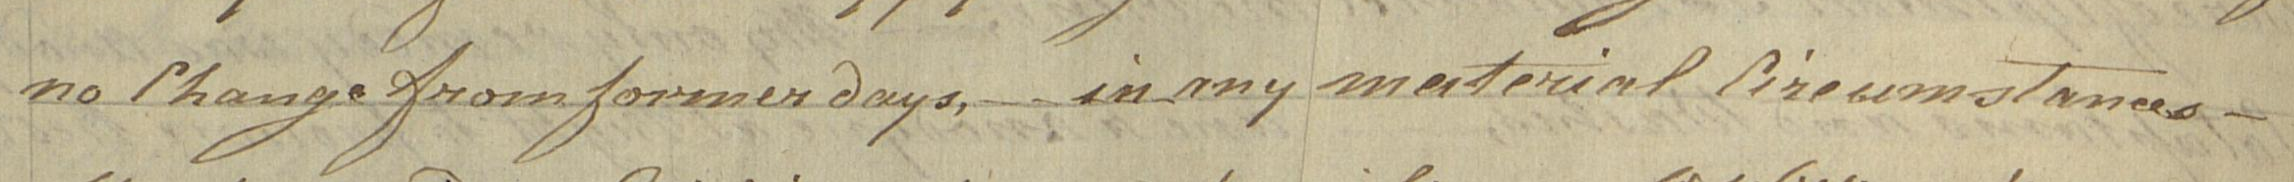no Change from former days in my material Circumstances
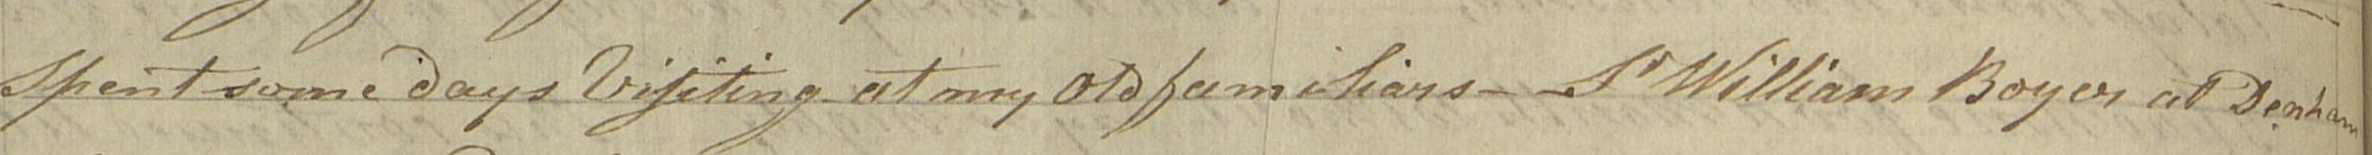Spent some days Visiting at my old familiars, S^r. Willliam Boyer at Denham
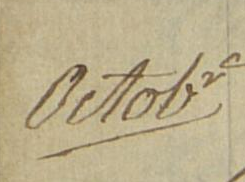Octob^r
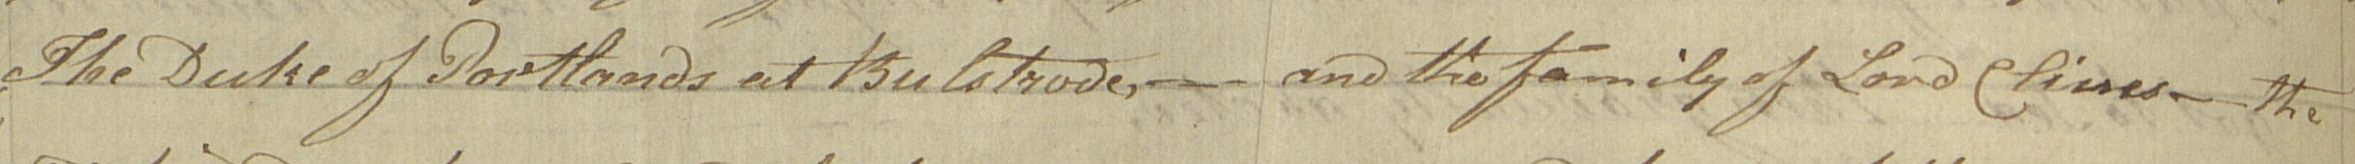The Duke of Portlands at Bulstrode, and the family of Lord Clives, the
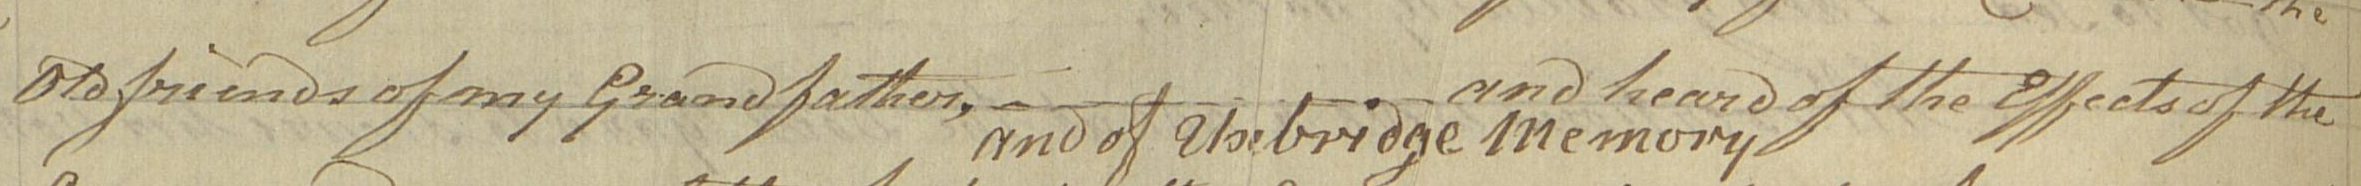old friends of my Grandfather, and heard of the Effects of the
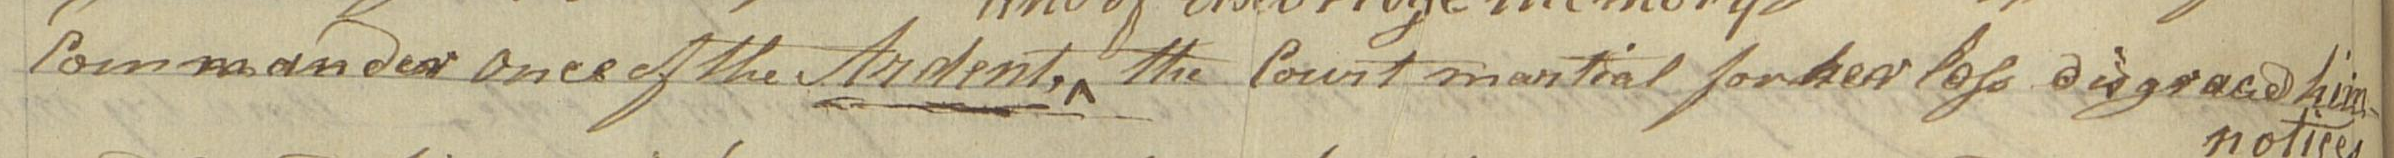Commander once of the Ardent ^ the Court martial for her loss disgraced him
